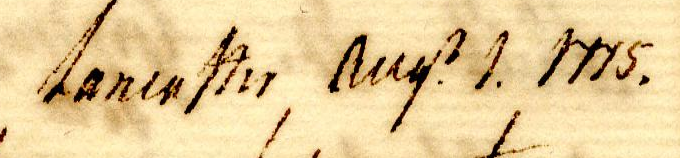Lancaster, Aug^t. 1. 1775.
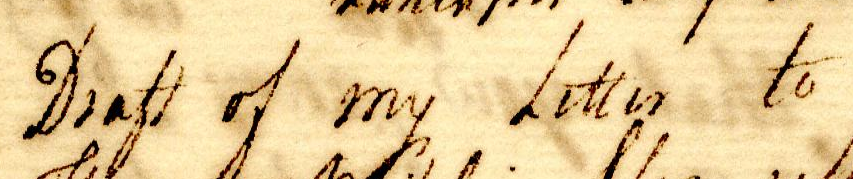Draft of my Letter to
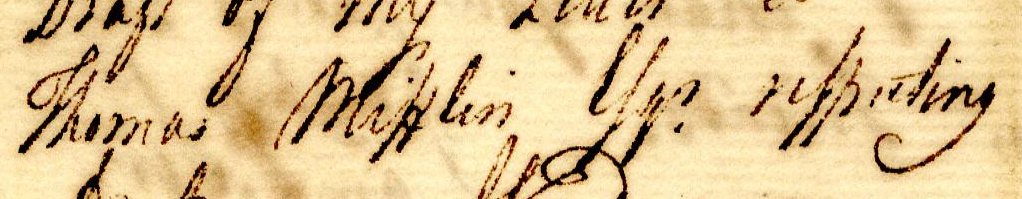Thomas Mifflin Esq^r. respecting
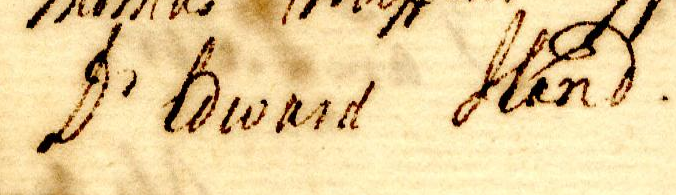D^r Edward Hand.
